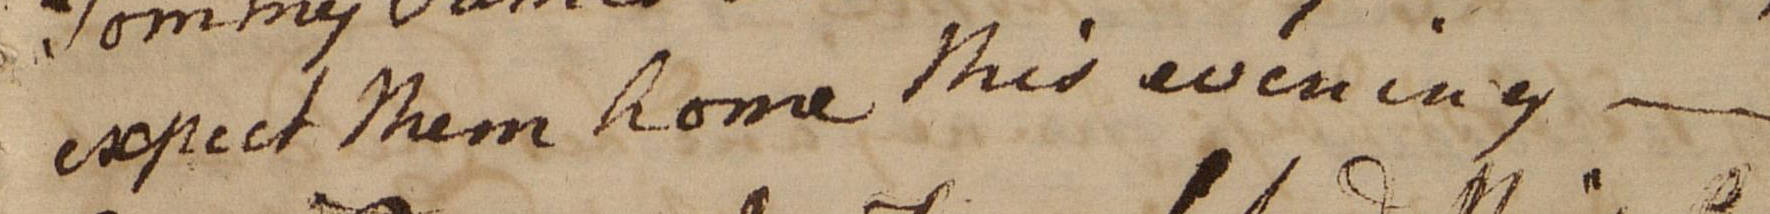expect them home this evening-
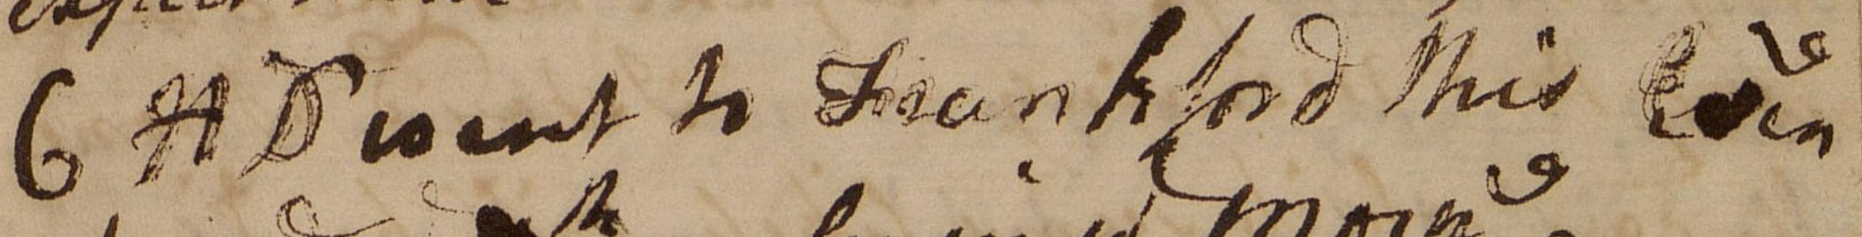6 HD went to Frankford this Even^g
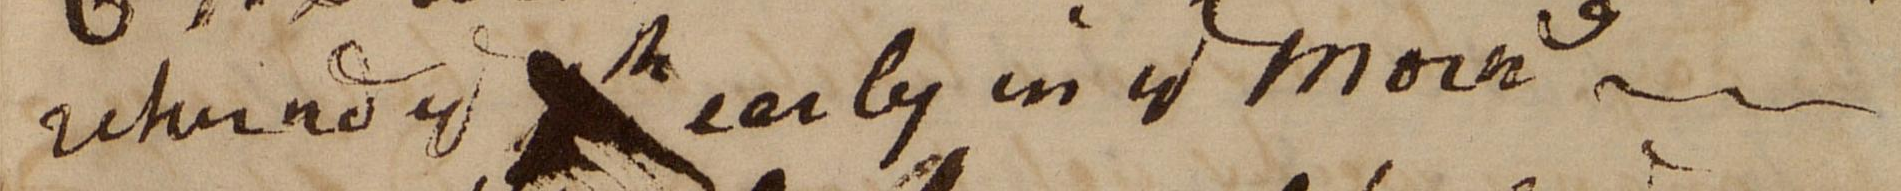returnd y^e [7]^th early in y^e Morn^g--
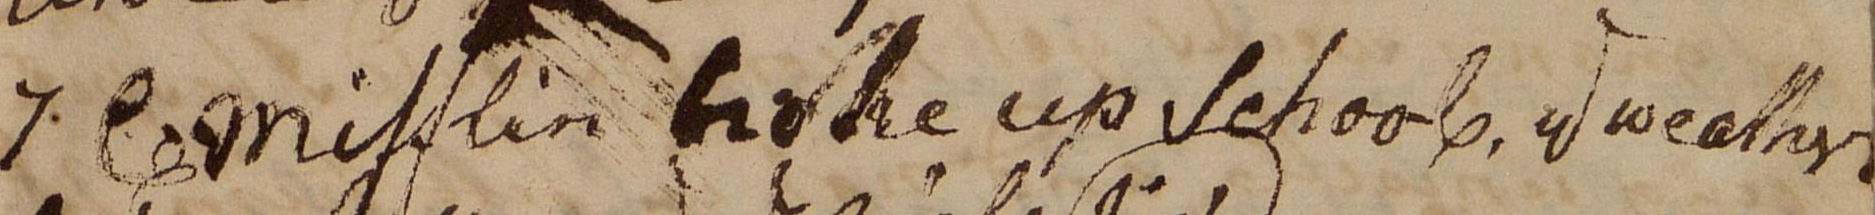7 C. Mifflin broke up School, y^e weathr
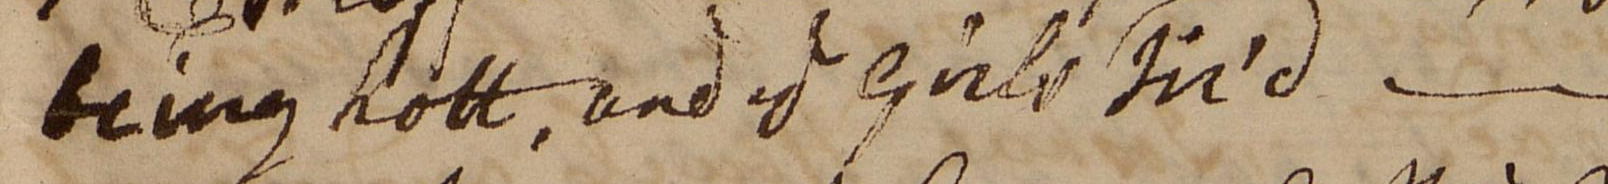being hott, and y^e Girls tir'd-
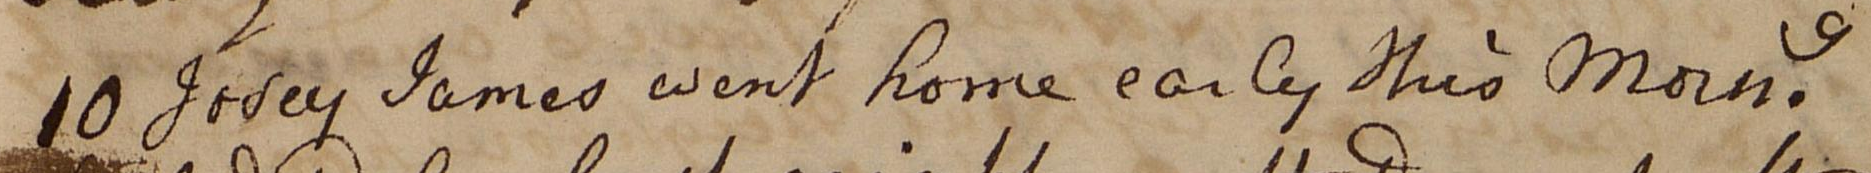10 Josey James went home early this Morn^g.
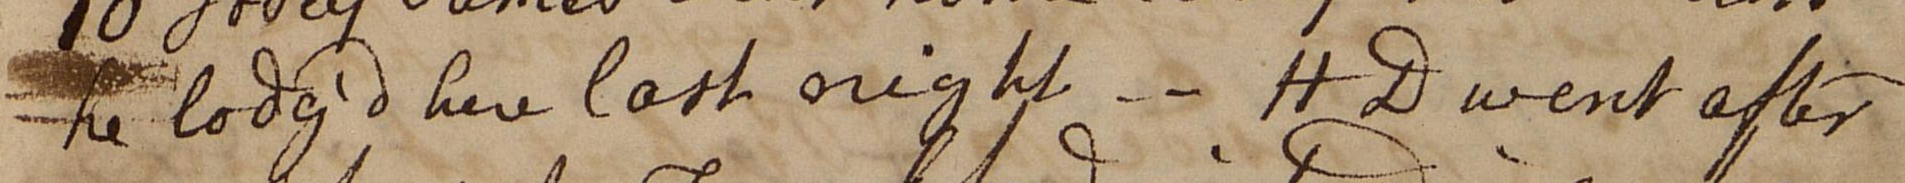he lodg'd here last night-- HD went after
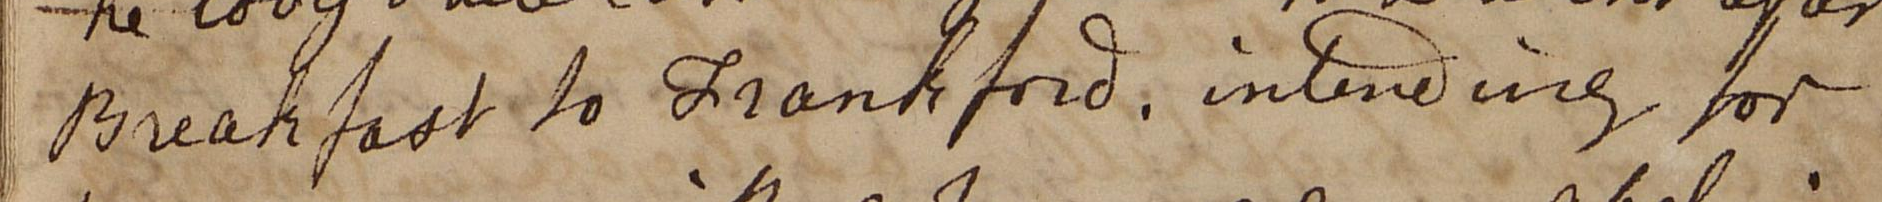Breakfast to Frankford, intending for
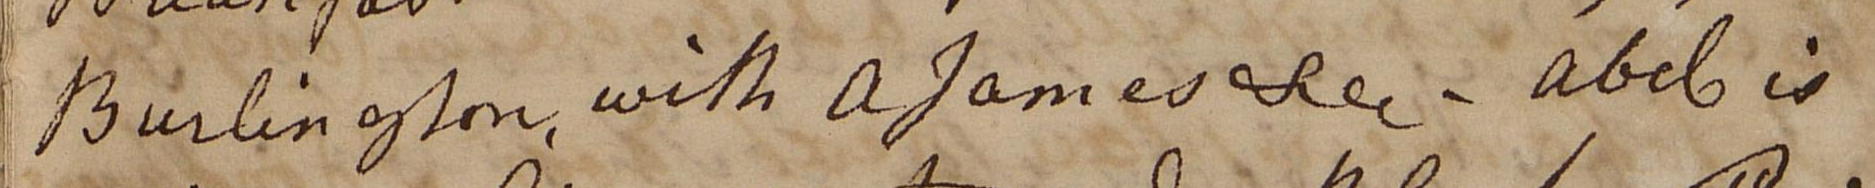Burlington, with A James &c- Abel is
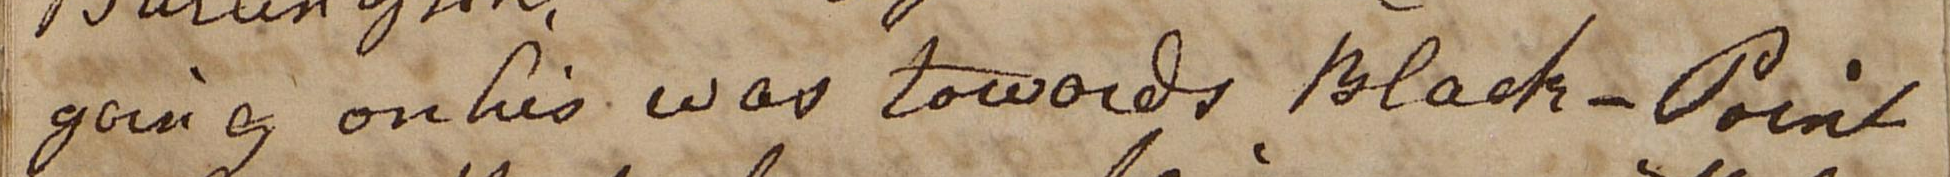going on his was towards Black-Point
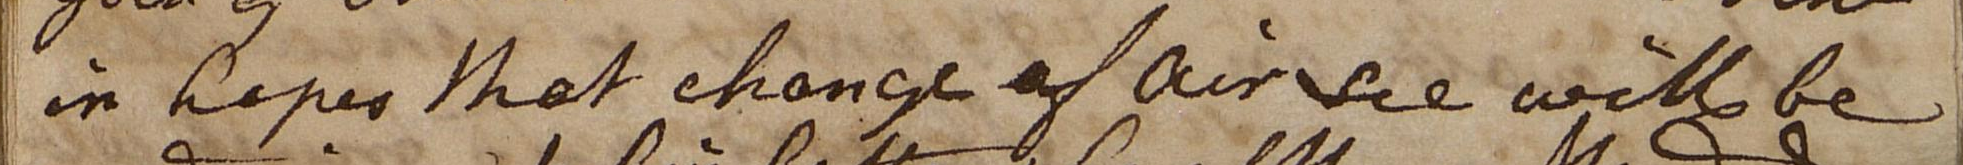in hopes that change of Air &c will be
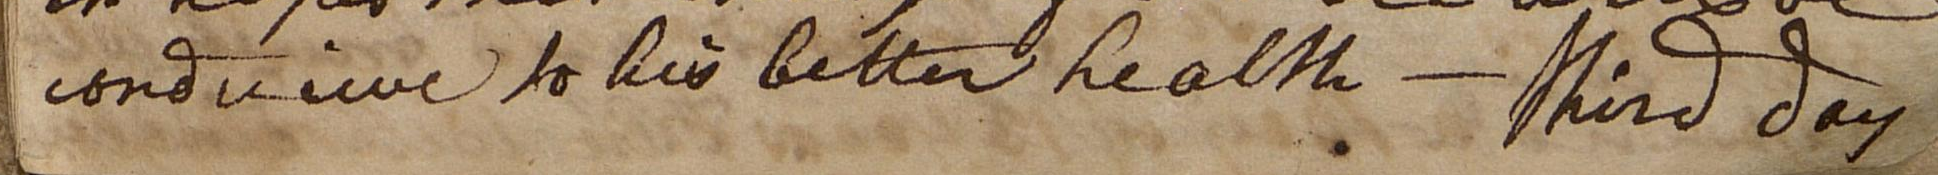conducive to his better health- third day
